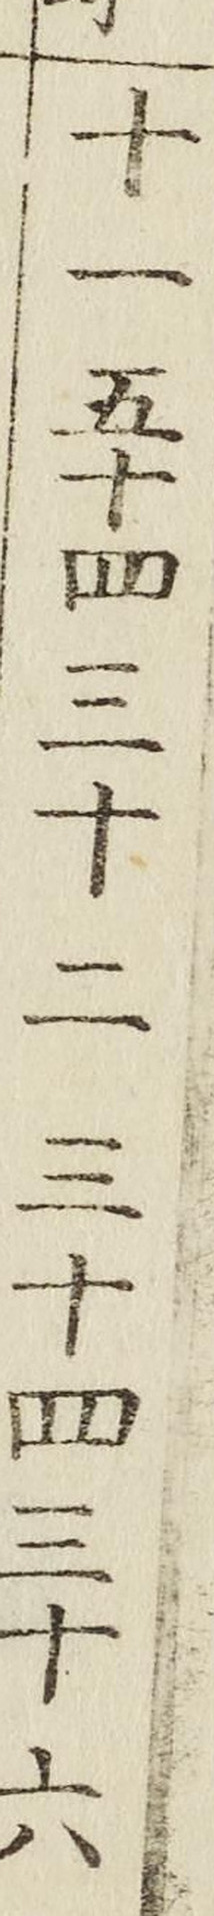駿河十一五十四三十二三十四三十六
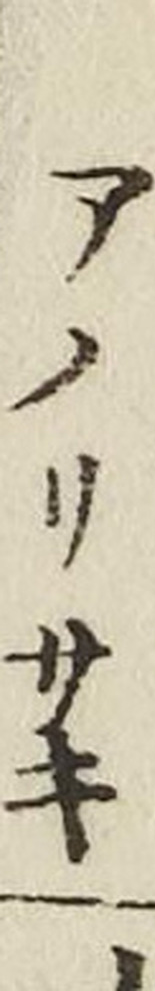アノリサキ
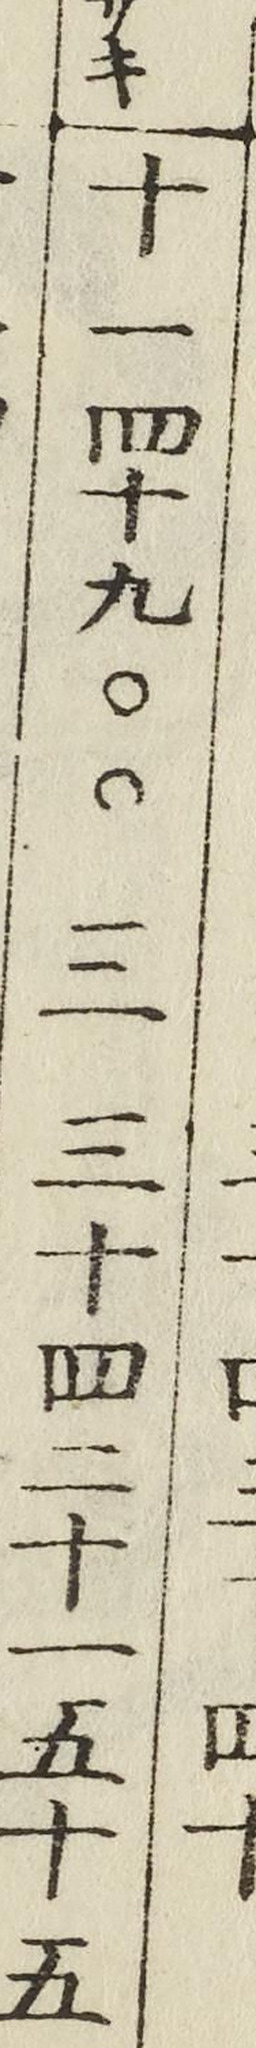マトヤ十一四十九〇〇三三十四二十一五十五
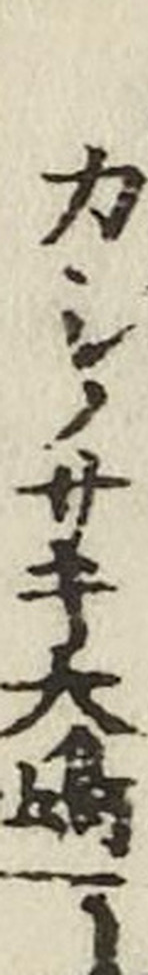ガシノサキ大嶋
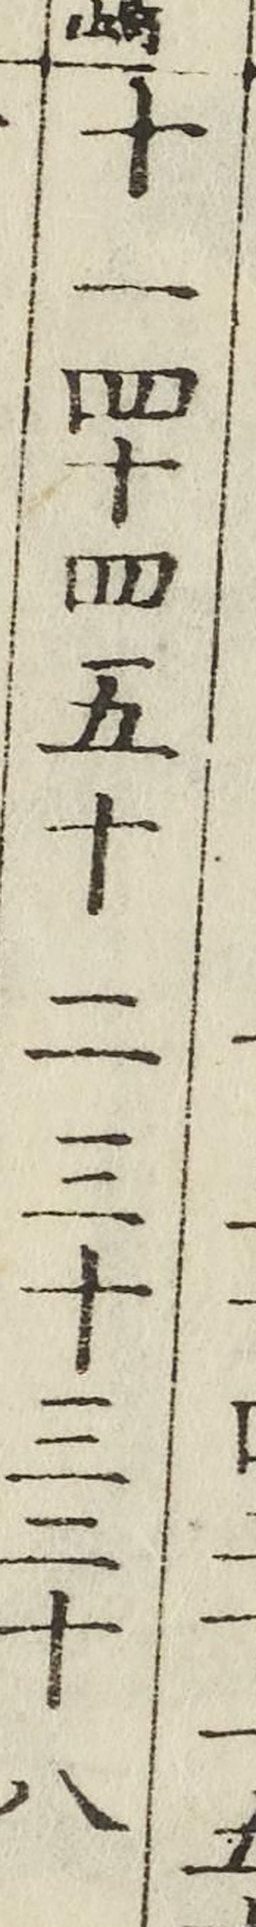紀伊十一四十四五十二三十三二十八
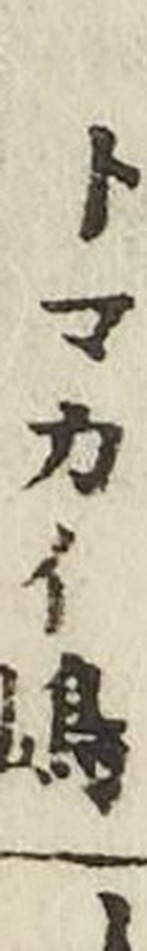トマカイ嶋
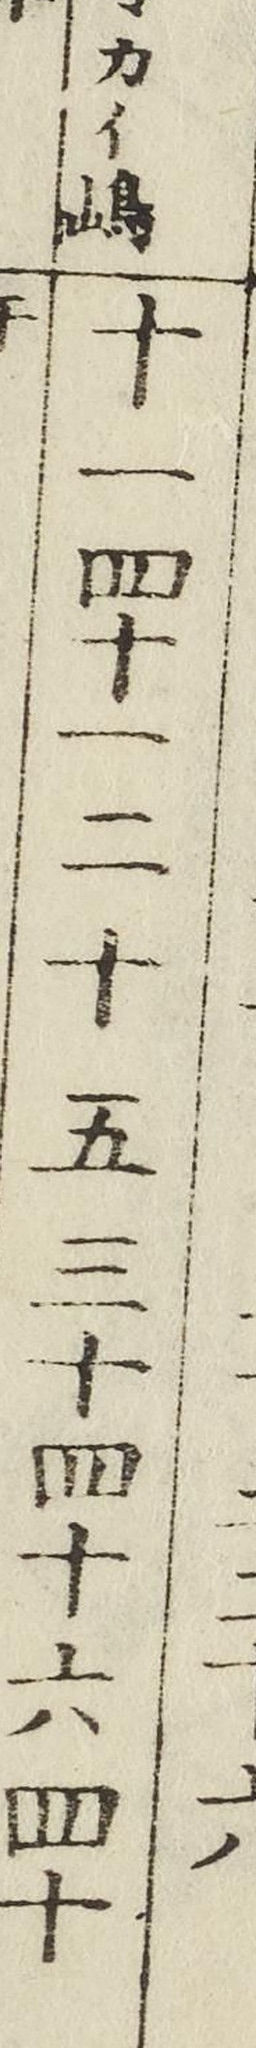泉十一四十一二十五三十四十六四十
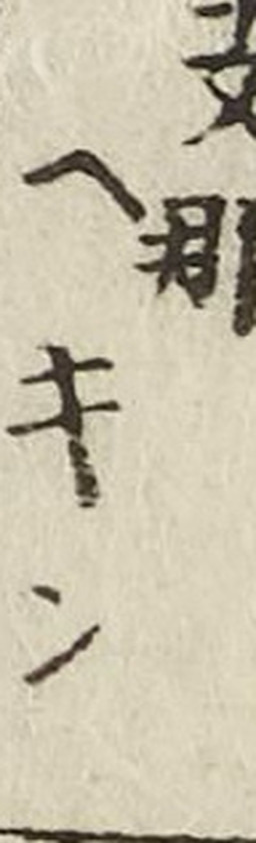ヘキン
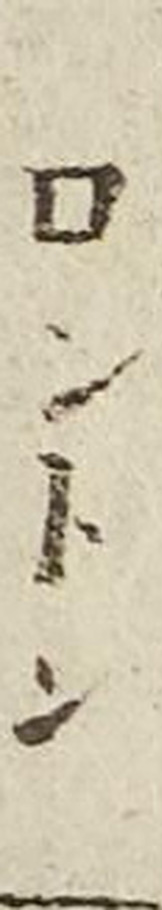ロントン
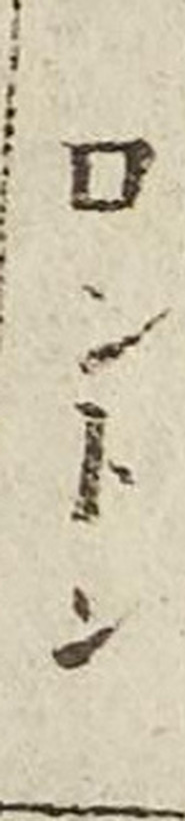ロントン
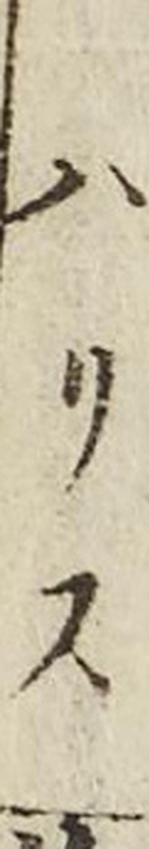ハリス

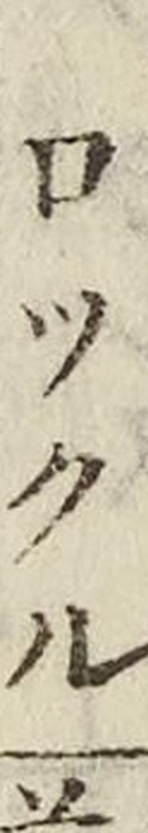ロツクル
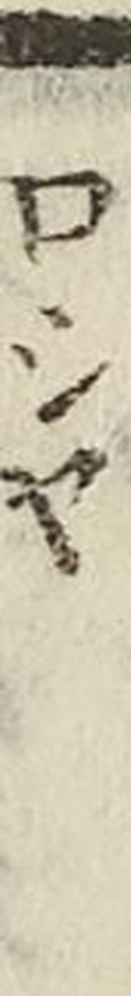ロシヤ
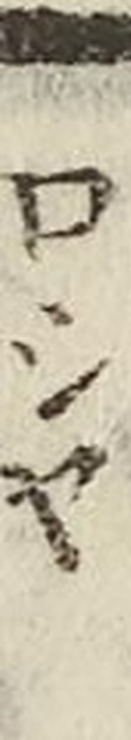ロシヤ

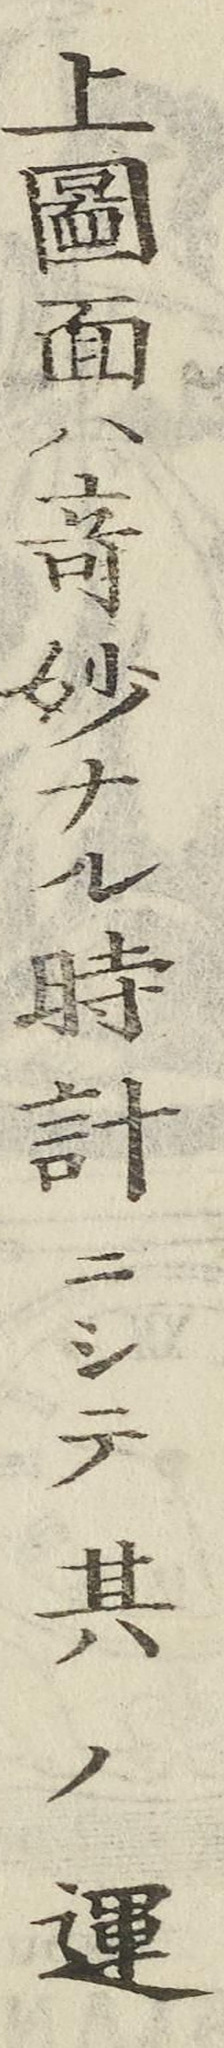上図面ハ奇妙ナル時計ニシテ其ノ運
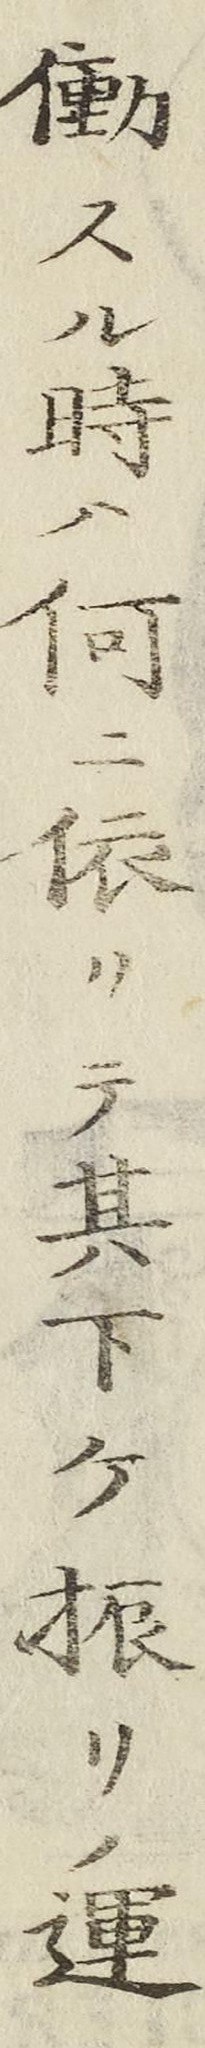働スル時ハ何ニ依リテ其下ケ振リノ運
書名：[時計に関する冊子]
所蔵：東京大学地震研究所図書室 Earthquake Research Institute Library, The University of Tokyo, JAPAN
